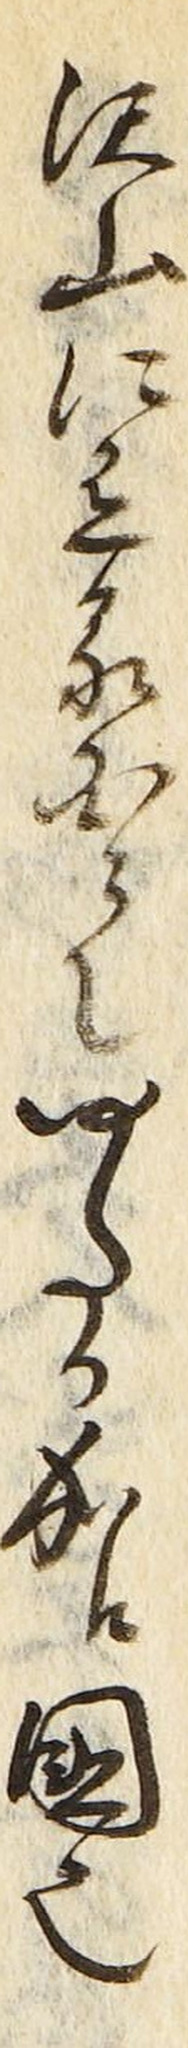沢山に有る国にしゆたか成る国也
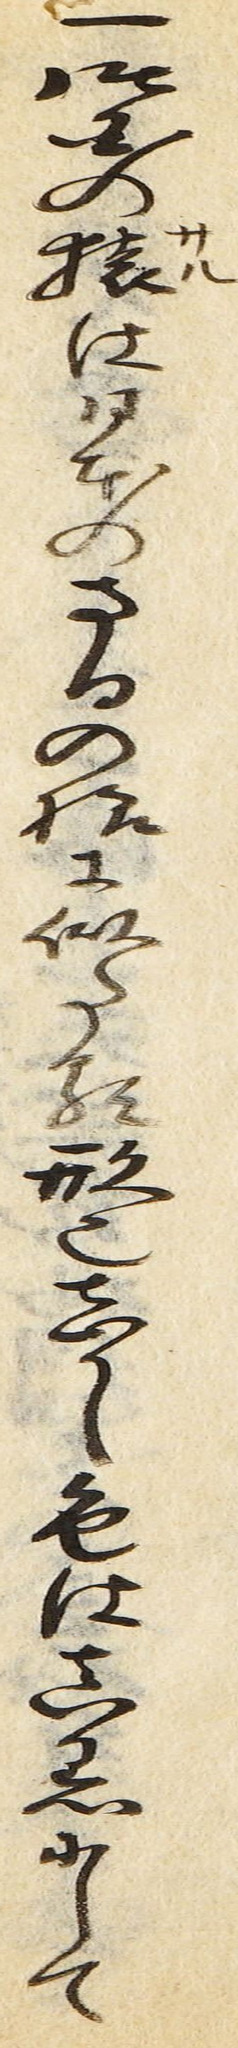一此国の猿は日本のさるの様に似たる形也しかし色は真黒にして
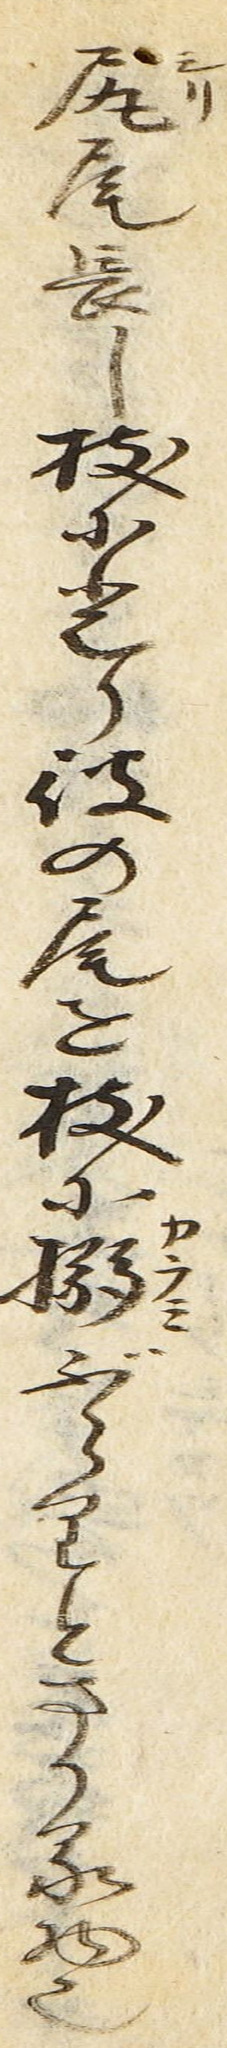尻尾長し枝に登り彼の尾を枝に搦ぶらりとさかる物也
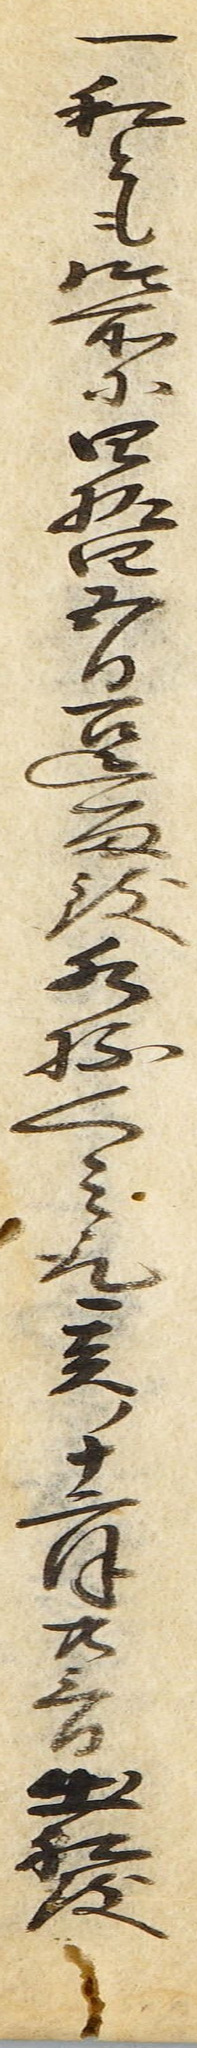一私とも此所に四拾四五日逗留致水抔くみ取亥ノ十二月廿三日出船致
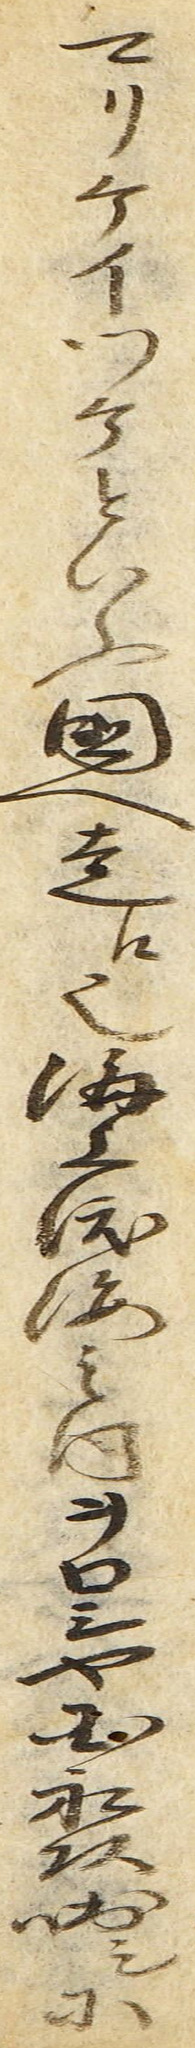マリケイツケといふ国へ走る也海上渡海之内ヲロシヤ国船頭はな咄しに

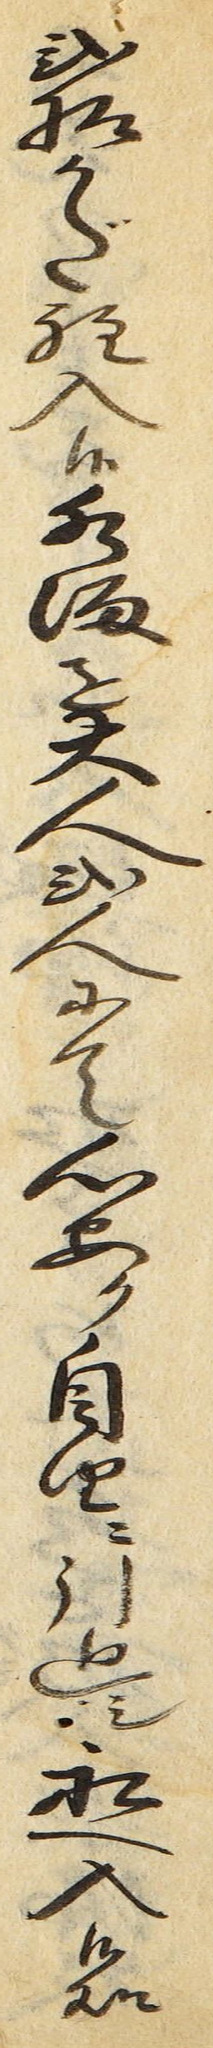弐拾かだ程入候水桶を大人弐人にて心安く自由に引回し船へ入候処
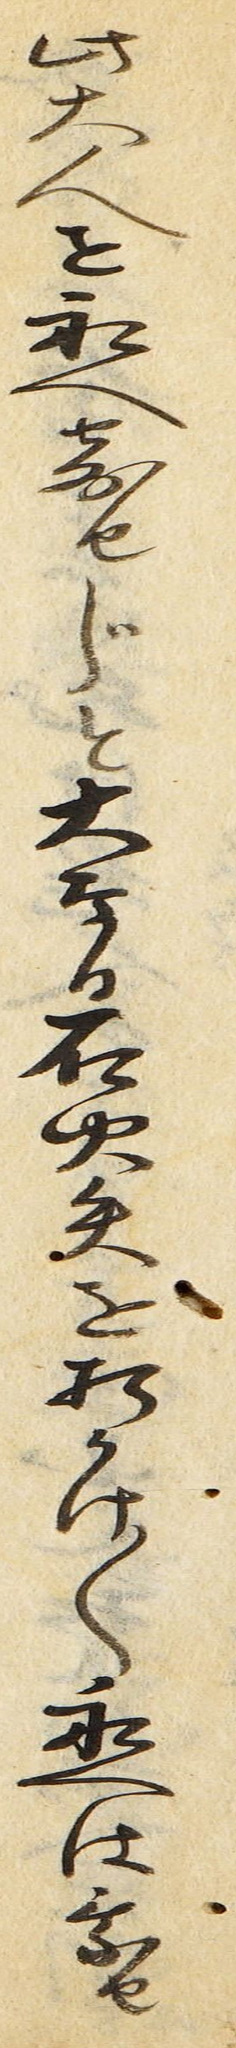此大人を船へ寄せじと大なる石火矢を打かけ〳〵船へは乗せ
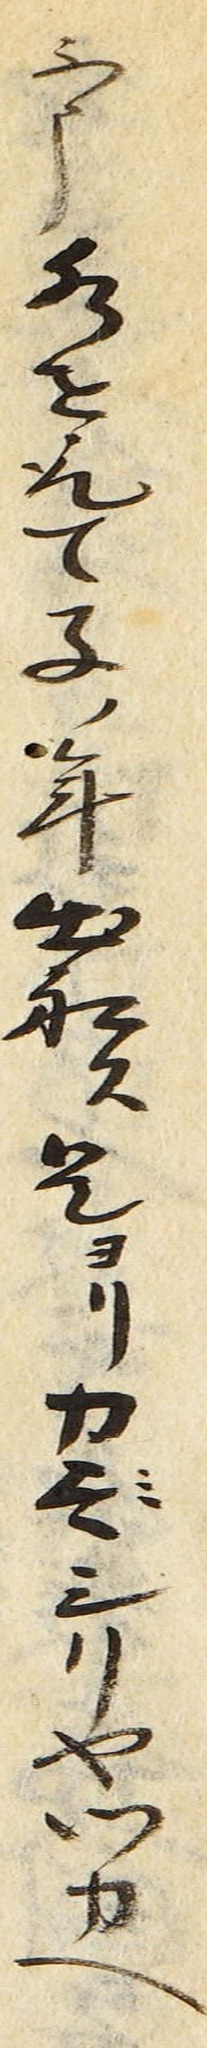不申水を取て子ノ年出船す是よりカミシリヤツカへ
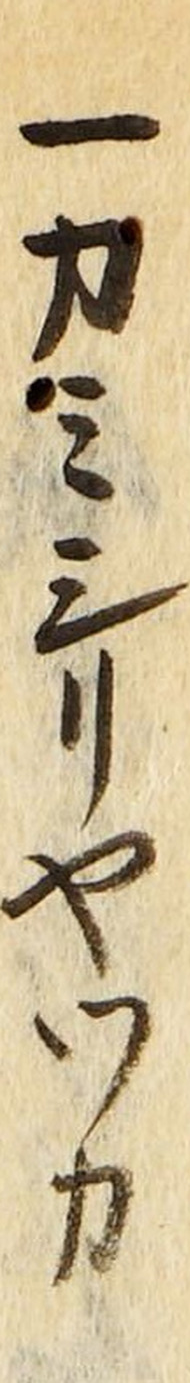一カミシリヤツカ
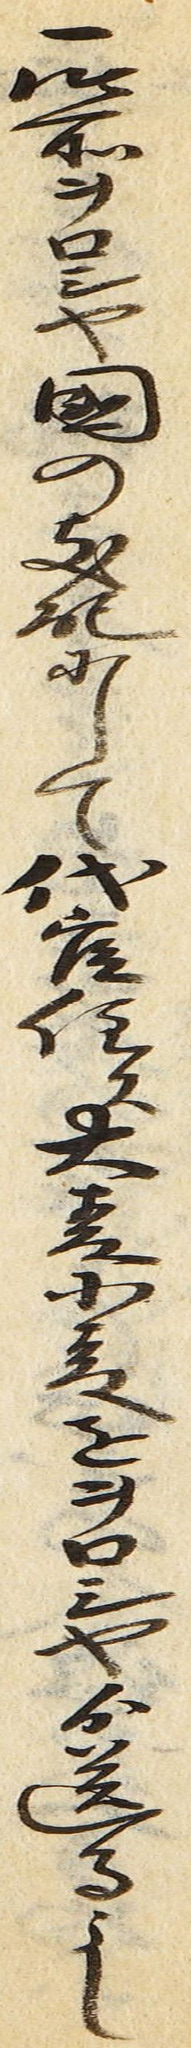一此所ヲロシヤ国支配にて代官住す大麦小麦をヲロシヤゟ送るよし
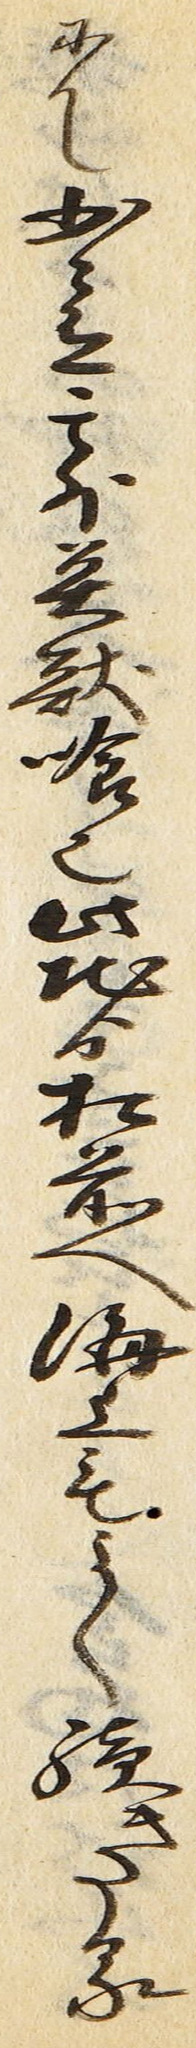にて少々有其外魚獣喰也此地ゟ松前へ海上もよく強きたる
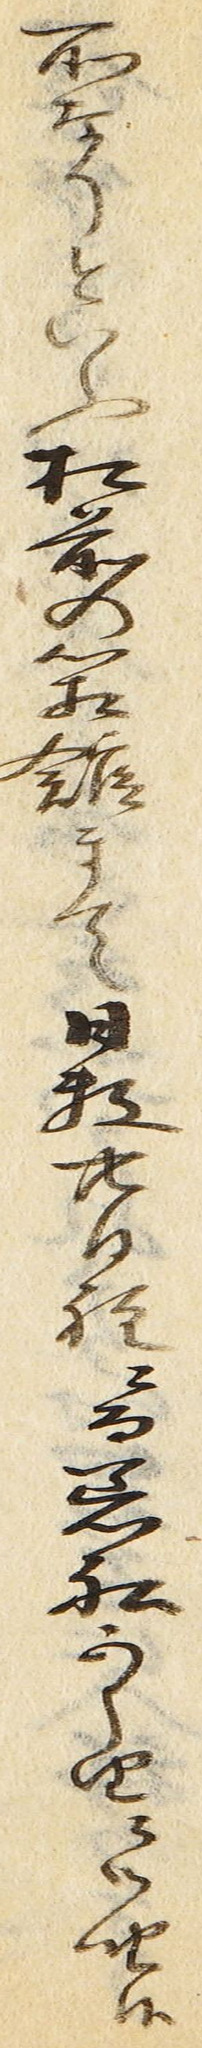所なりといふ松前の箱舘まて日数廿日程に而着船可申由に御坐候
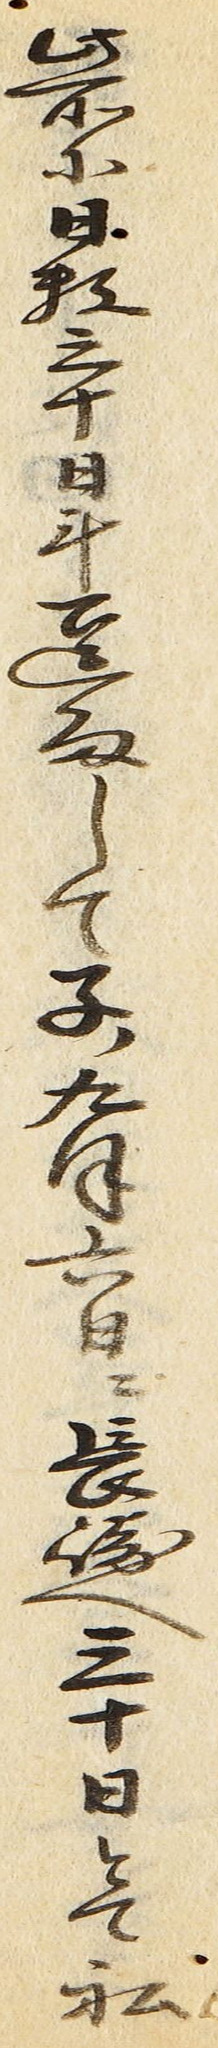此所に日数三十日計逗留して子ノ九月六日に長崎へ三十日とて船
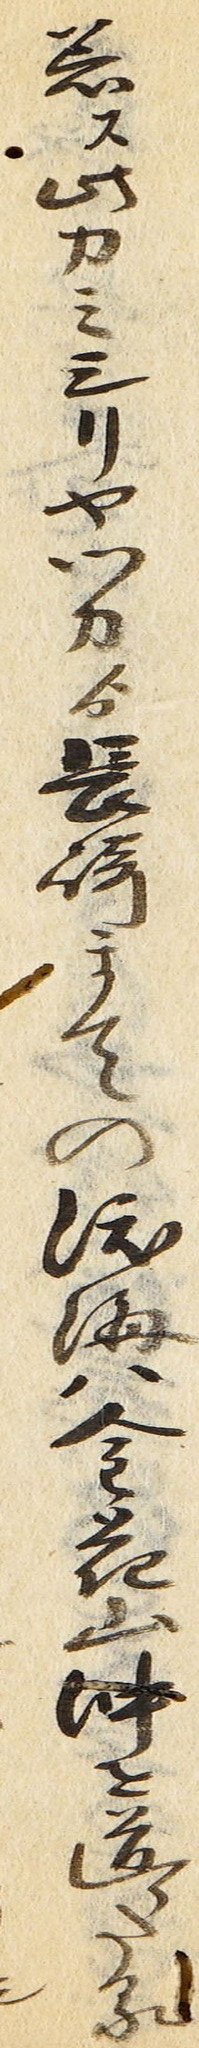着す此カミシリヤツカゟ長崎まての渡海は金花山沖を通りたる
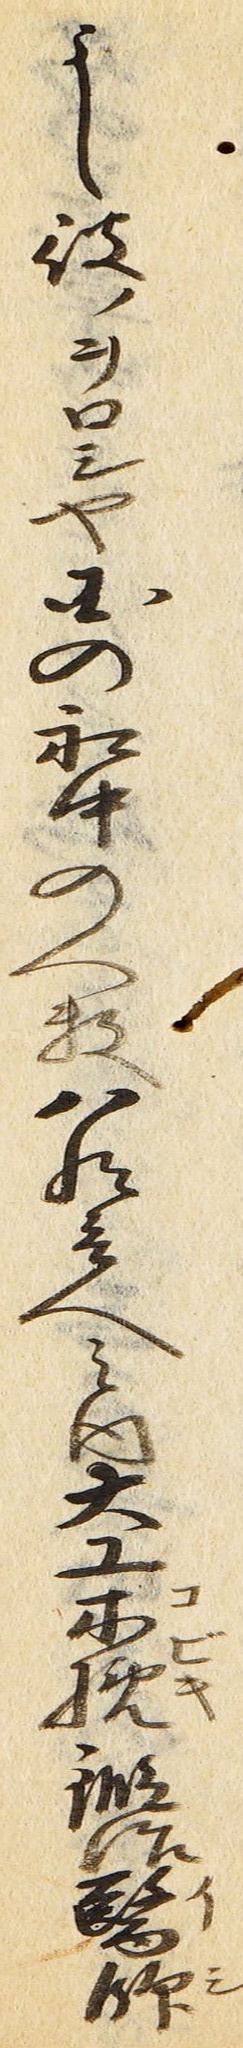よし彼ノヲロシヤ国の船中の人数八拾壱人之内大工木挽鍛冶医師
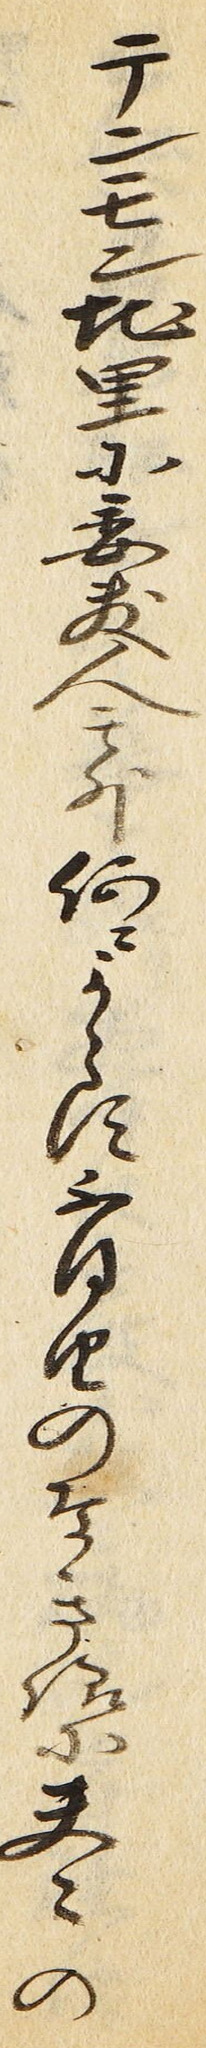テンモン地里に委敷人其外何によらす不自由のなき様に夫々の
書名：外国漂流記
